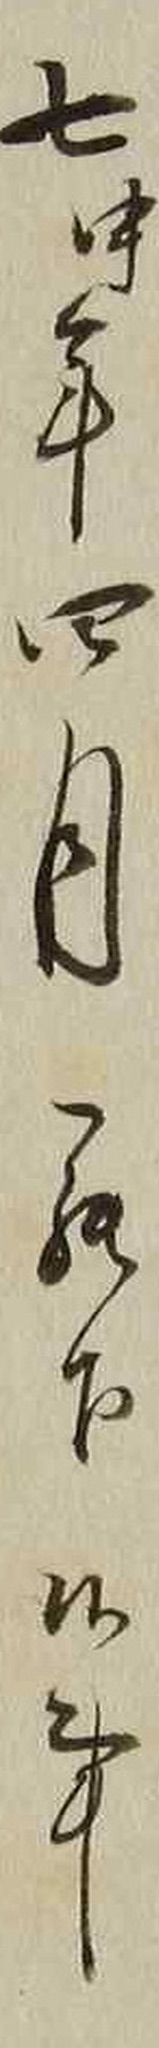七申年四月罷下候事
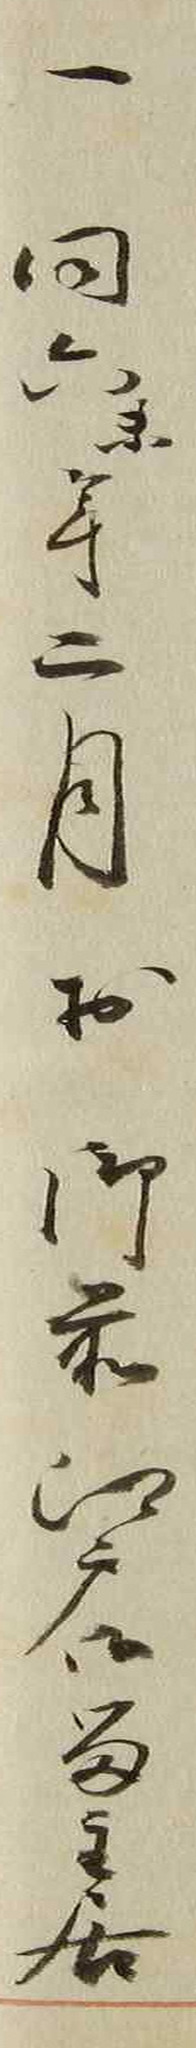一同六未年二月於御前江戸御留主居
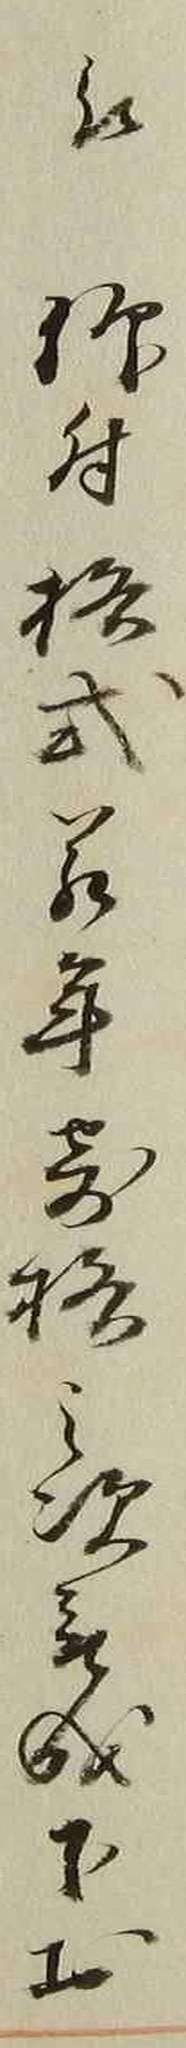被仰付格式若年寄格之次被成下於
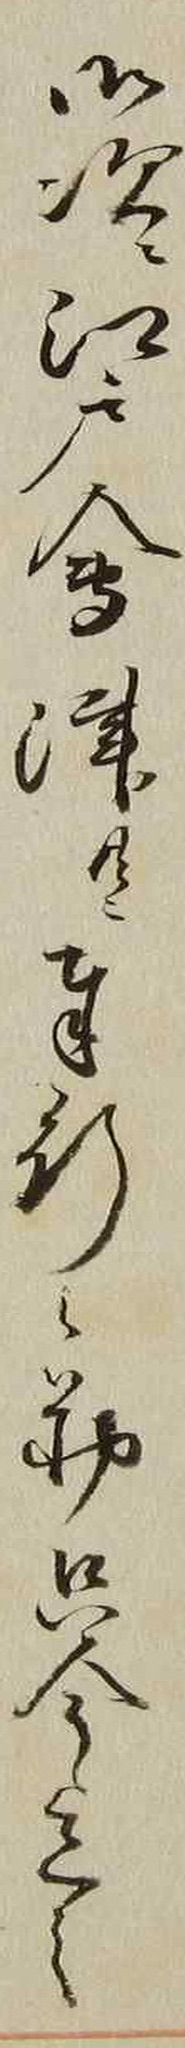御次ニ江戸会津共奉行之勤只今迄之
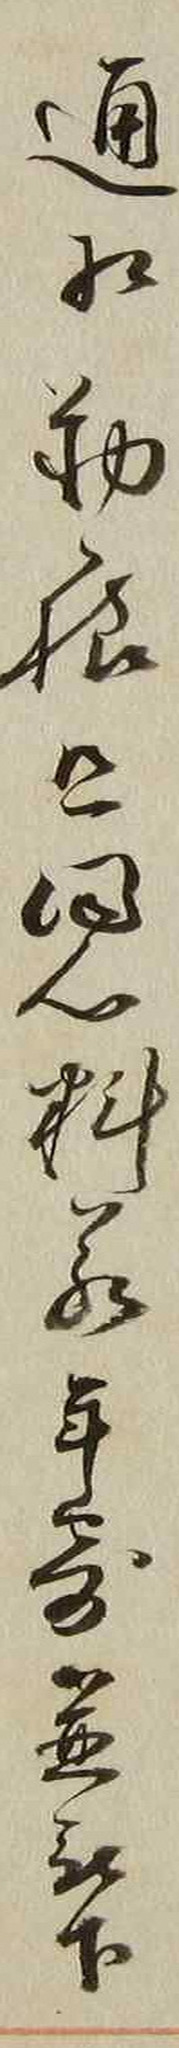通被相勤候様御同心料若年寄並被下
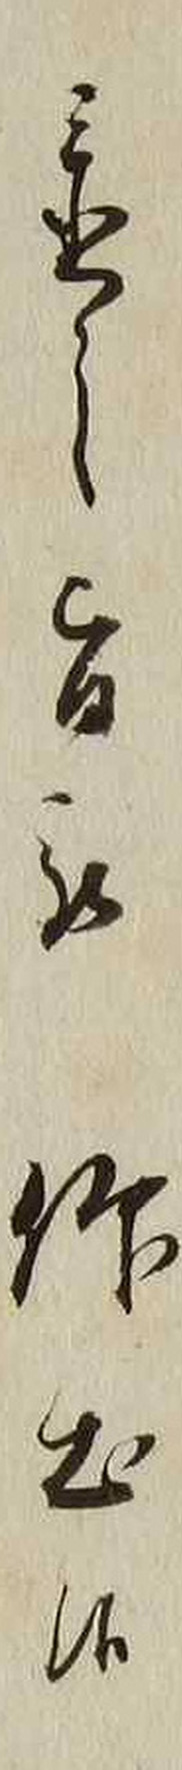置之旨被仰出候
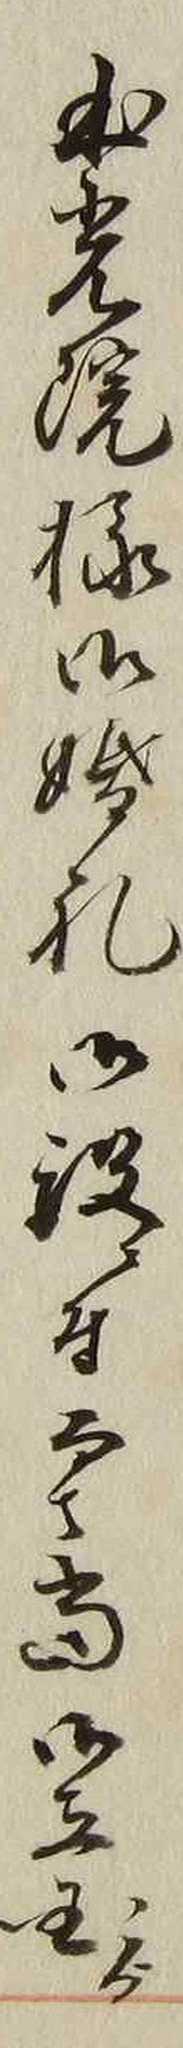本光院様御婚礼御役ニ付者当御在国ゟ
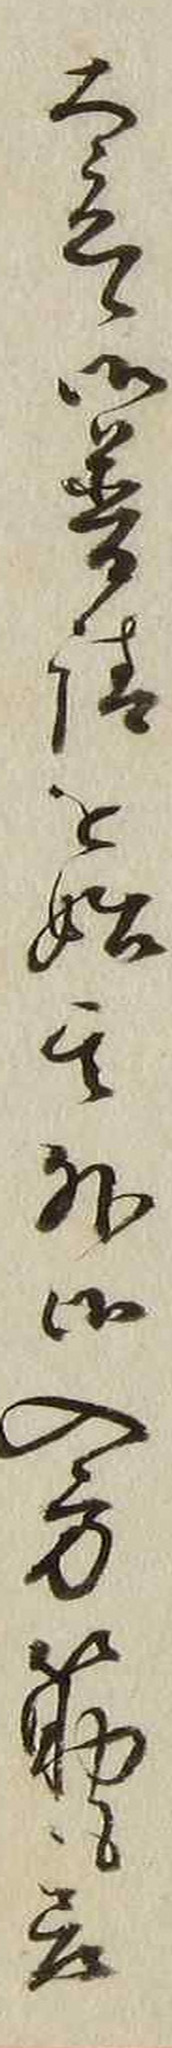大会へ御普請を始其外御入方筋も差
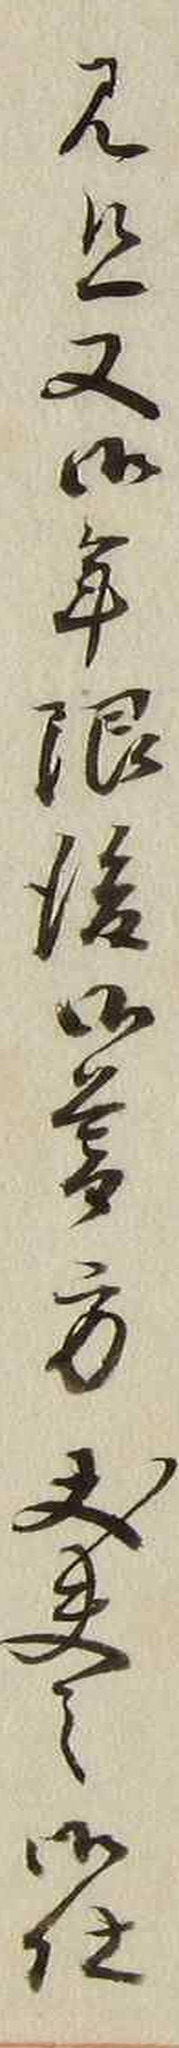見且又御年限後御暮方丈夫之御仕
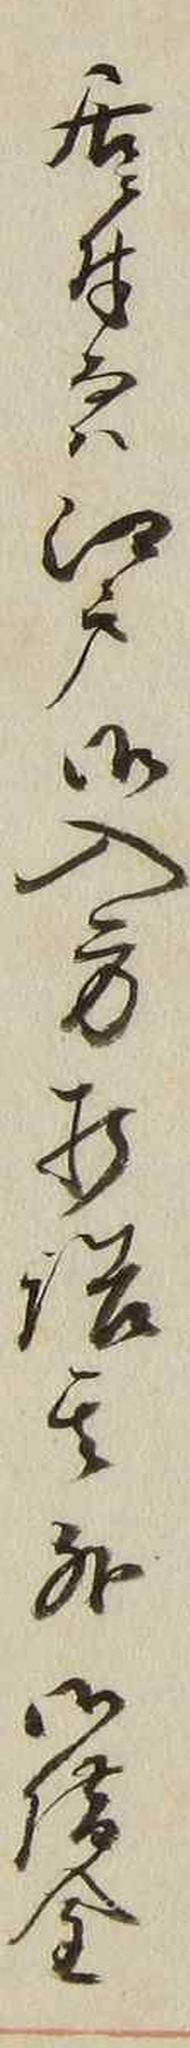居ニ付而ハ江戸御入方打繕其外御借金
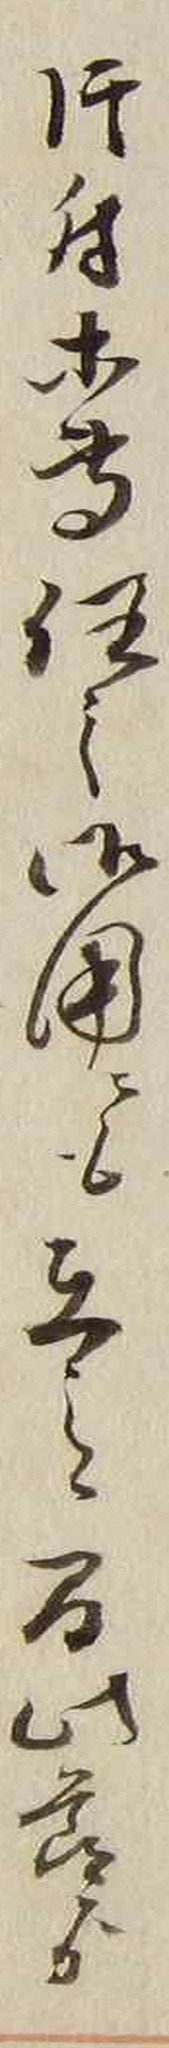片付等専任之御用ニも在之候間此節ゟ

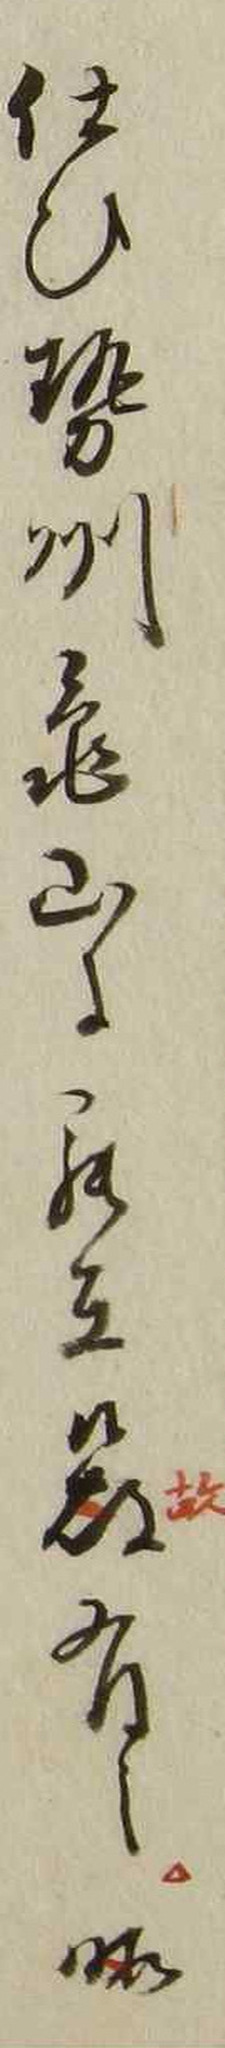仕ひ勢州亀山に罷在候故有之暇
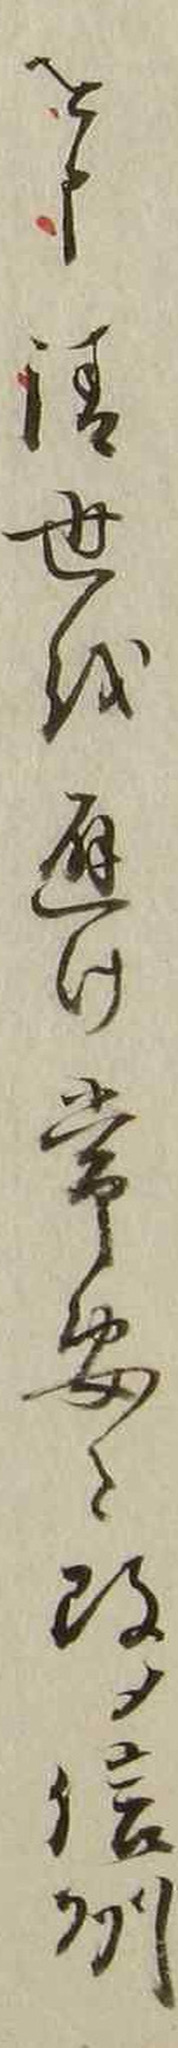をし清世を通け常安と改メ信州
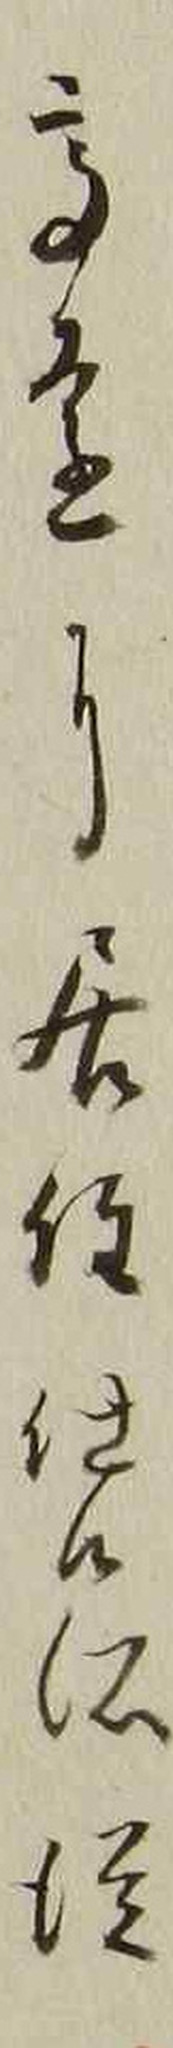高遠に居住仕候所従
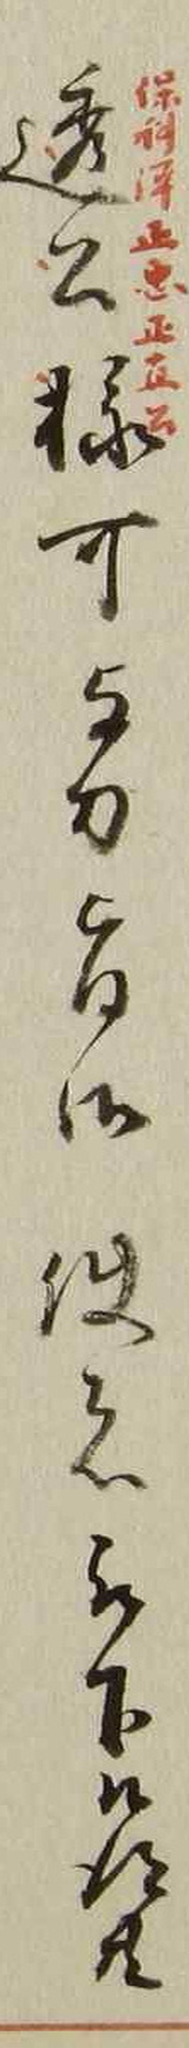透公様可与力旨御使者被下候得共
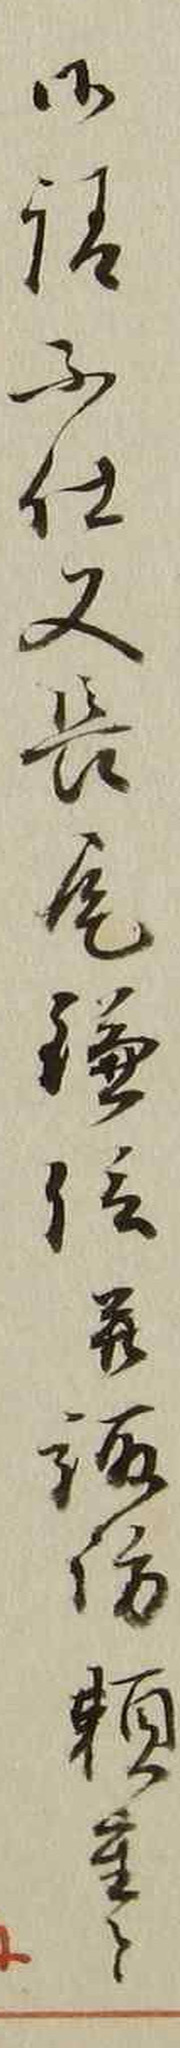御請不仕又長尾謙信并諏訪頼重と
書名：諸士系譜　巻之204　や之部1
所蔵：会津若松市立会津図書館
